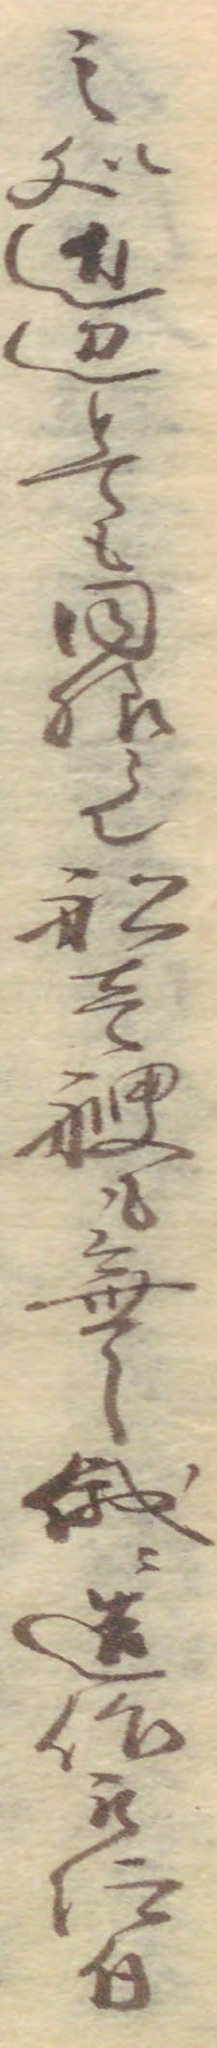之処近辺とても同様ニて船壱艘も無之俄ニ造作被仰付
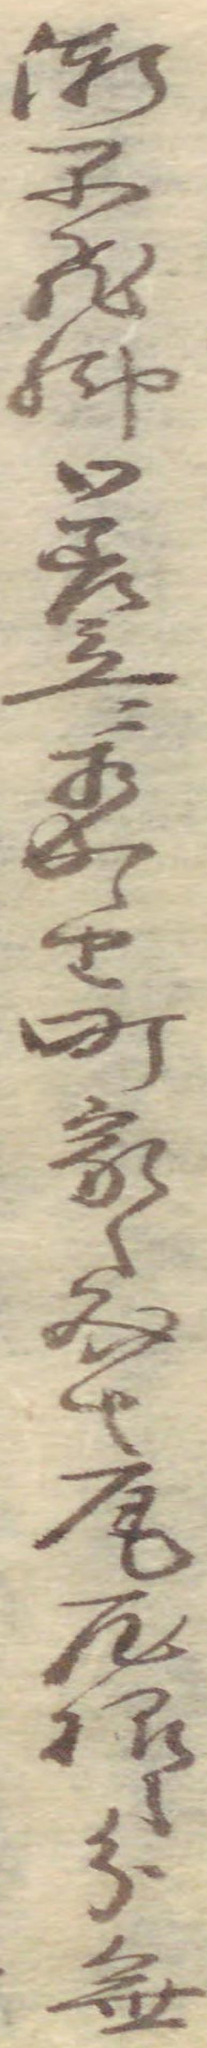漸早飛脚御差立ニ相成候由町家之義は瓦屋根之分無
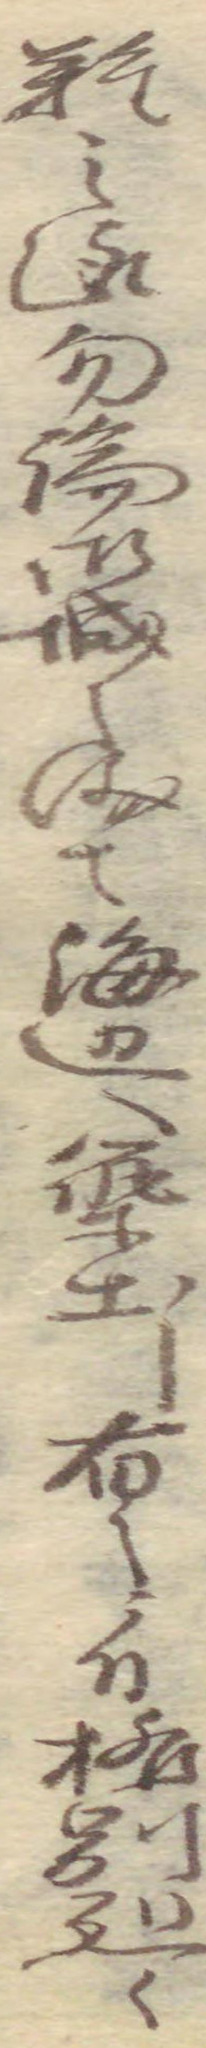難之趣勿論御城之儀は海辺へ築出し有之ニ付格別烈く
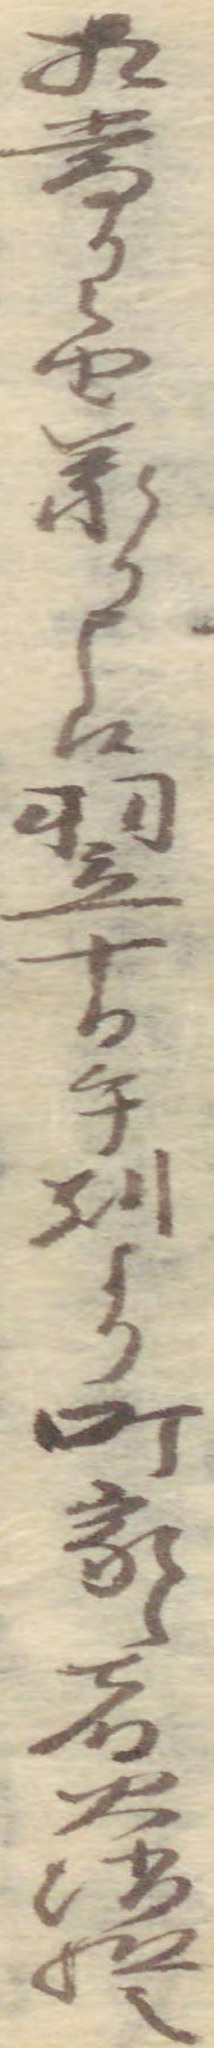相当り候由承り申候翌十日午刻より町家之者火消組之
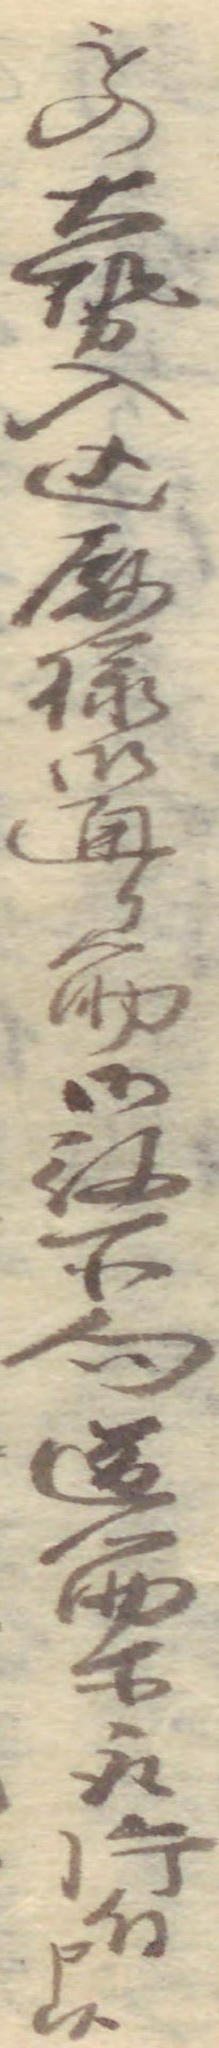もの大勢入込殿様御通り筋御役所向道筋等取片付申候
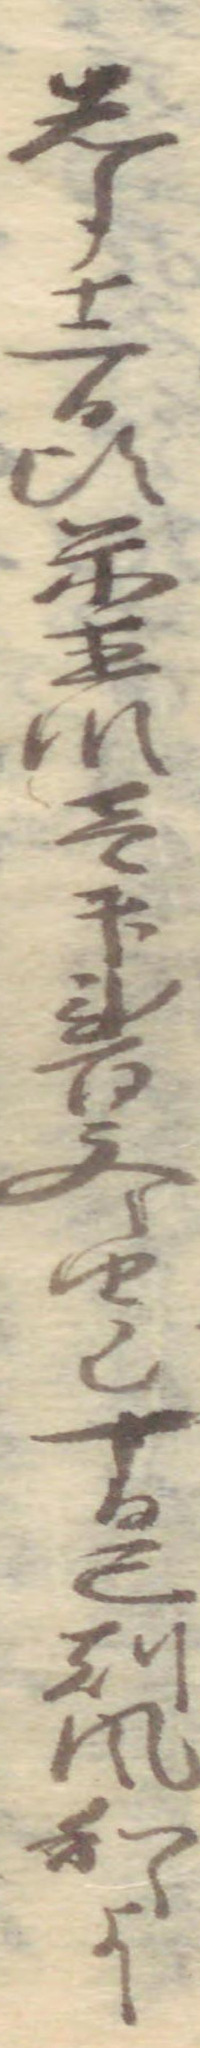先月十二日頃米直段壱升二百文之由ニて十日巳刻風和候よし
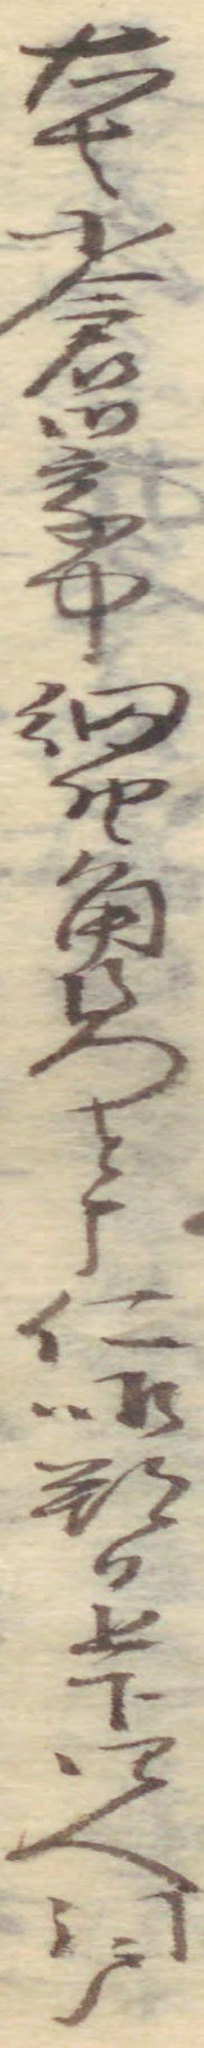右は小倉御家中細野角左衛門と申仁昨朔日上下四人引戸
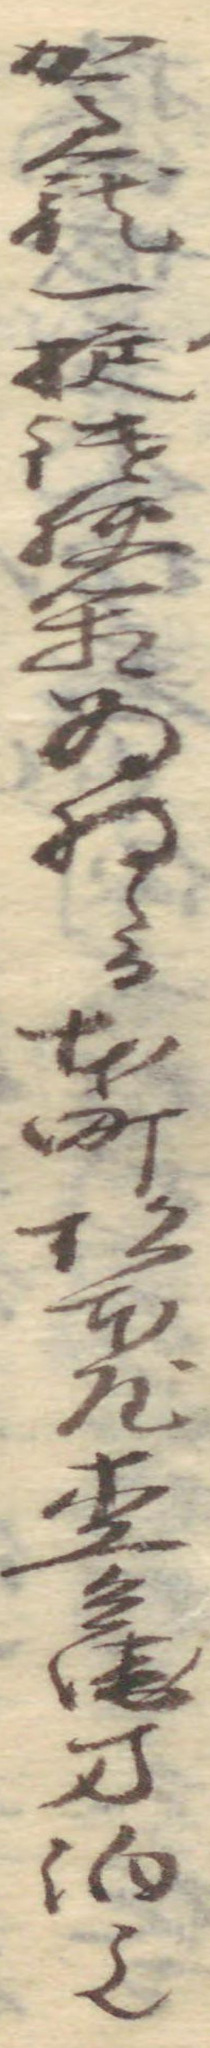駕籠一挺鑓挟箱為持候て本町松本屋杢兵衛方泊ニて
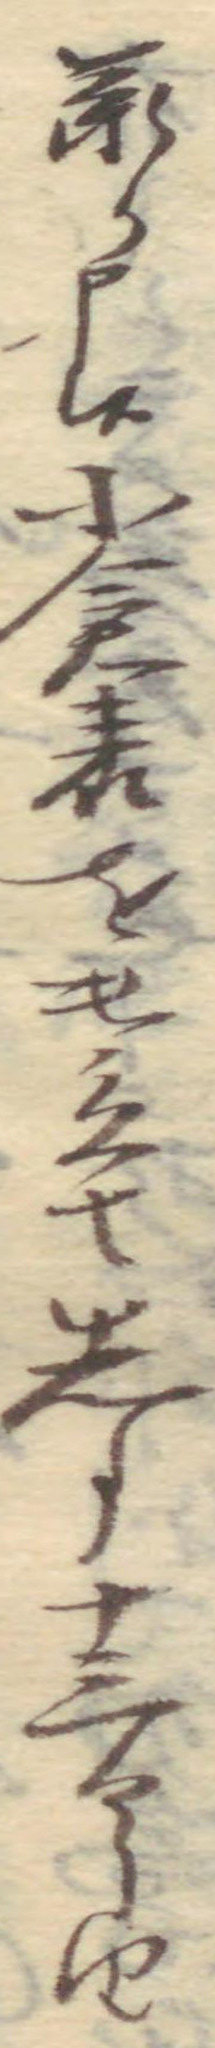承り申候小倉表を出立は先月十三日之由
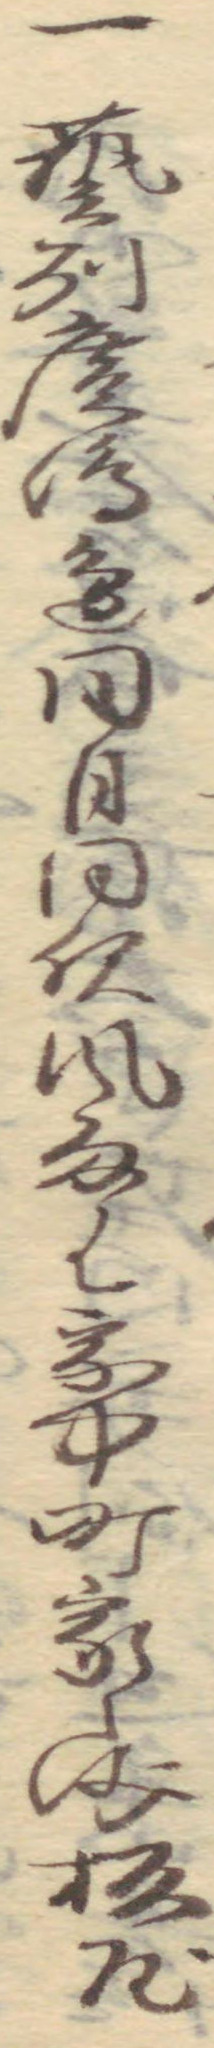一芸州広嶋辺同月同夜風雨ニて家中町家之儀板屋
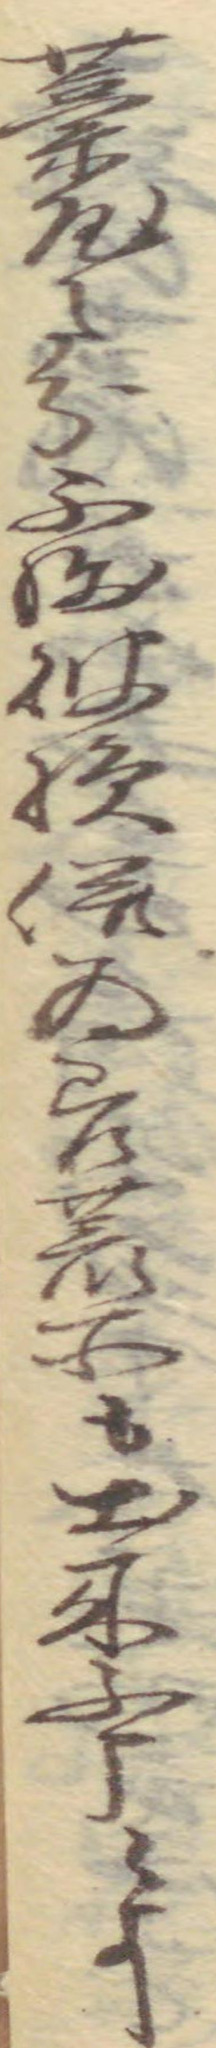藁屋之分不残破損併為差荒所も出来不申候よし
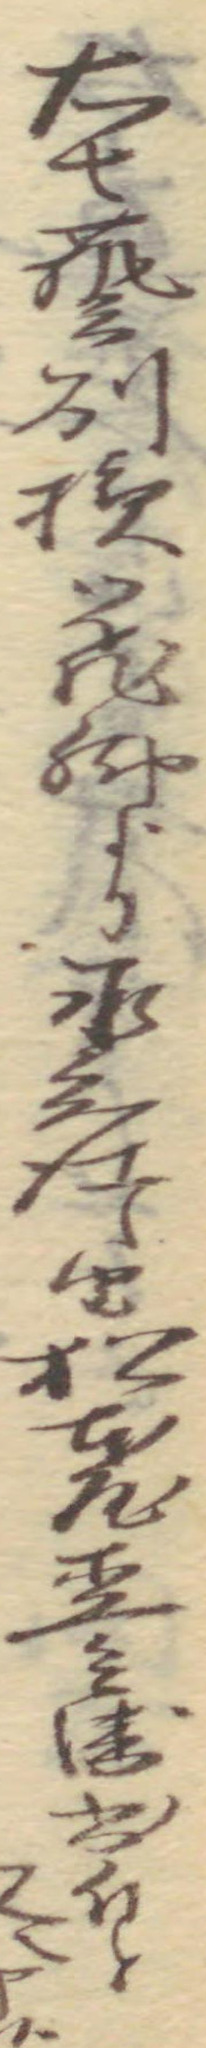右は芸州様御飛脚より承知仕候由松本屋杢兵衛書付に見へ申候
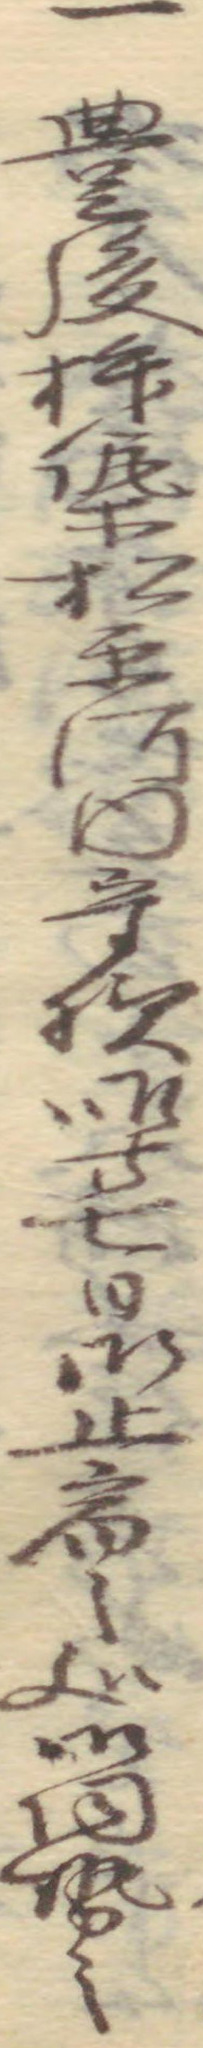一豊後杵築松平河内守様昨廿七日御止宿之処御同勢之
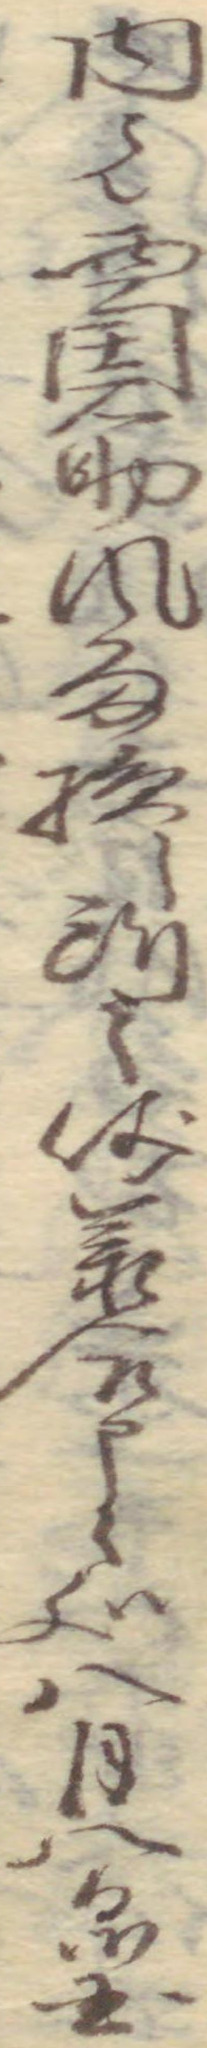内ニて西国筋風雨損候所之儀承合申候処八月八日御国
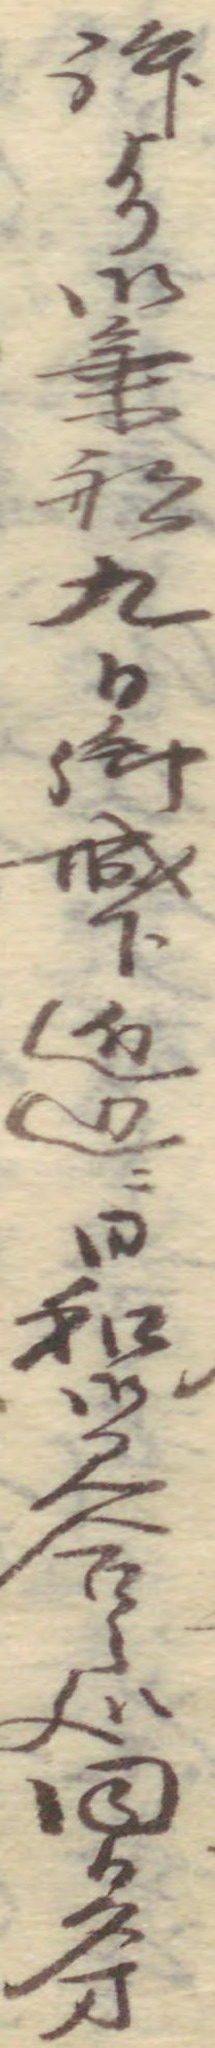許より御乗船九日御城下近辺ニ日和御見合候処同日夕方
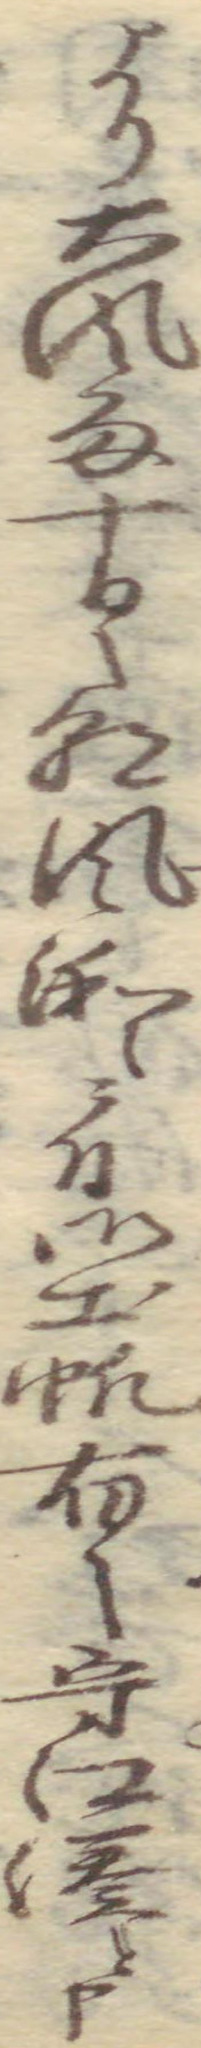より大風雨十日之朝風和候ニ付御出帆有之守江湊と申
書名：鶯宿雑記. 巻199-200
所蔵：国立国会図書館 National Diet Library, JAPAN
